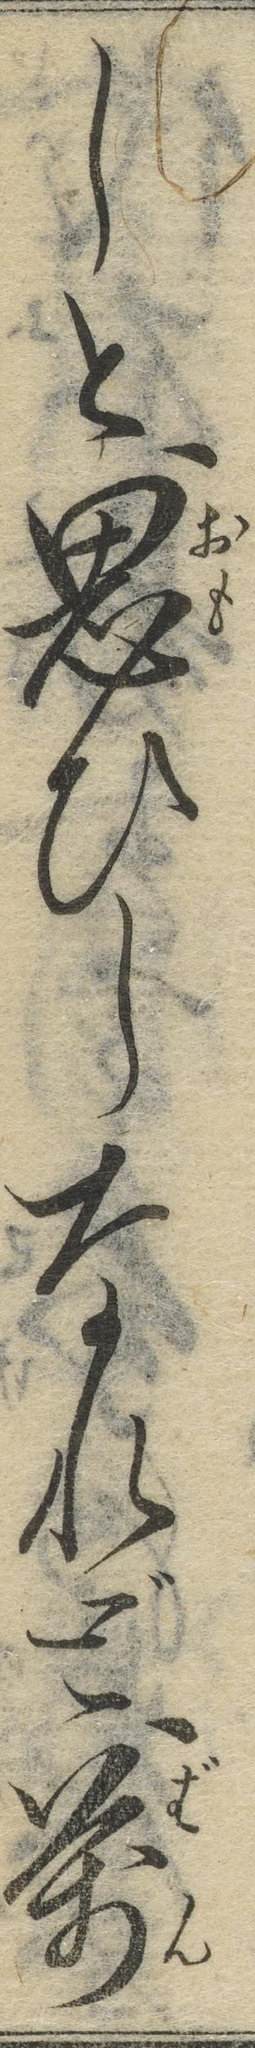しと、思ひしなれど、万

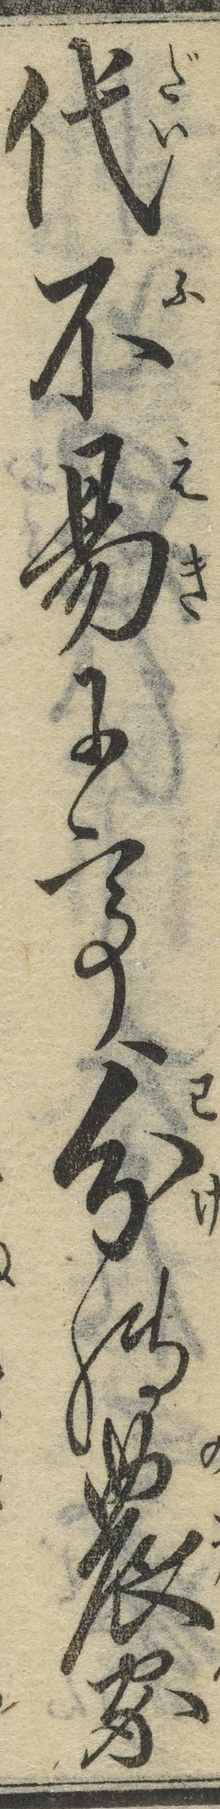代不易にて、分て農家
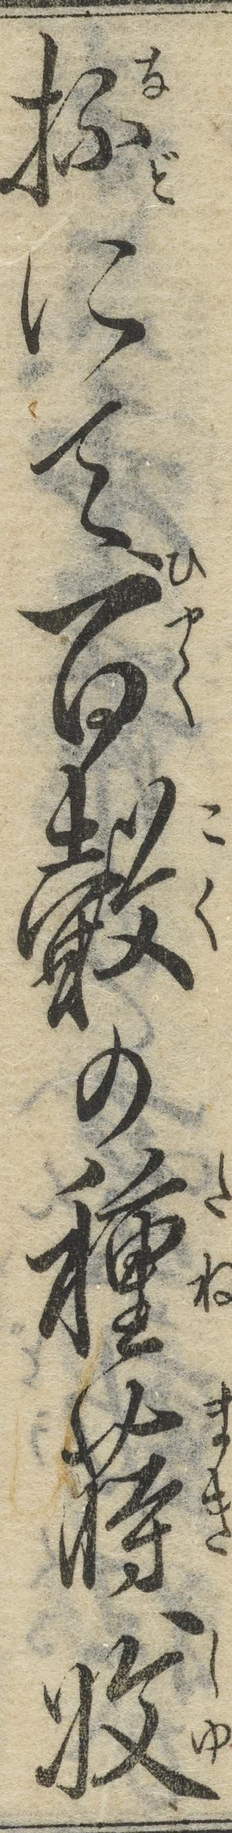抔にて、百穀の種蒔、収
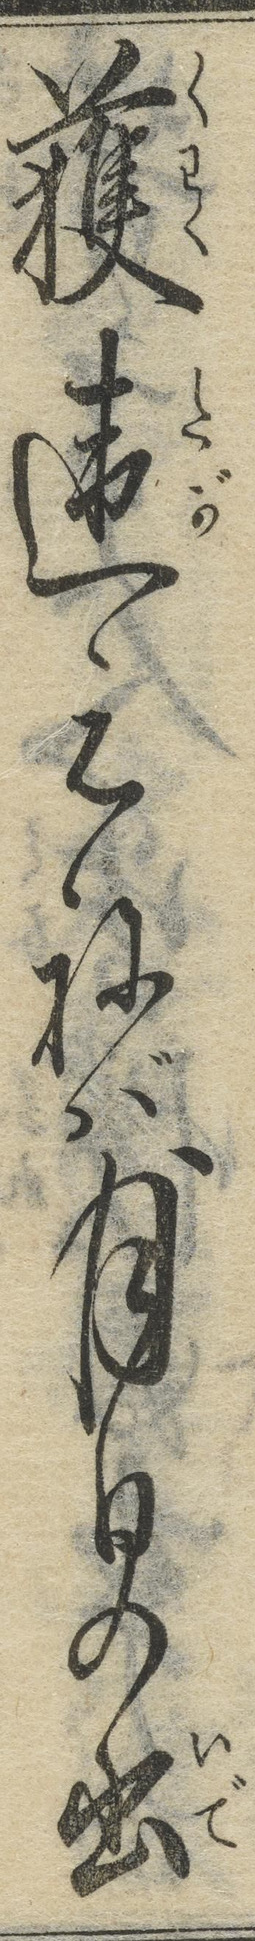穫違はねば、月日の出
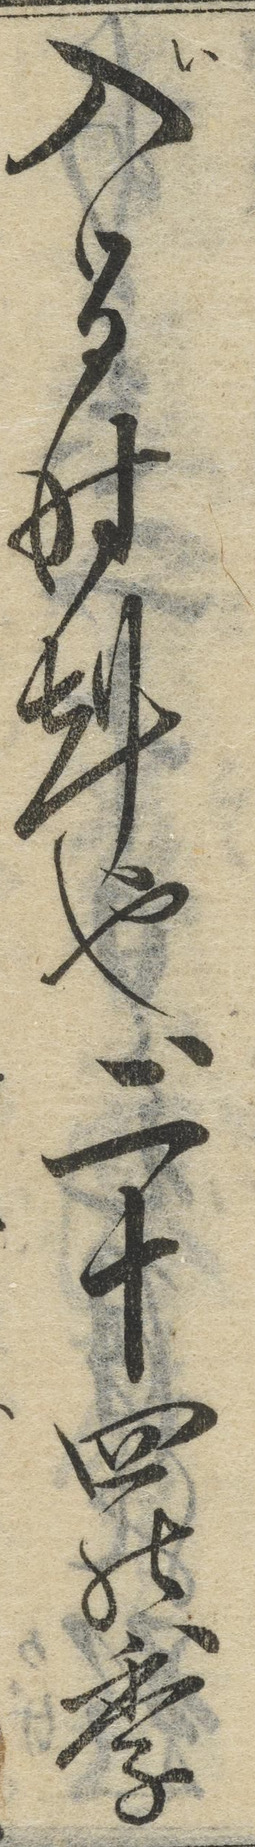入る時刻や、二十四の、季
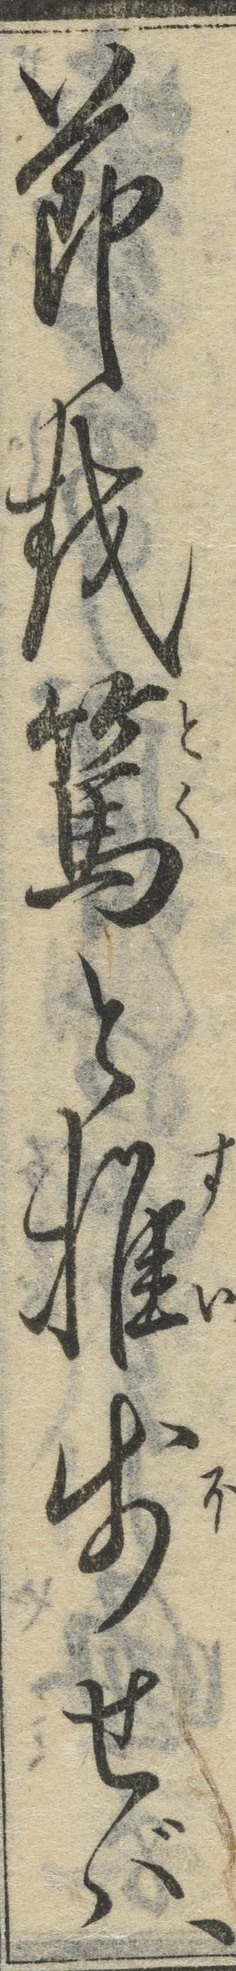節を篤と推歩せば、
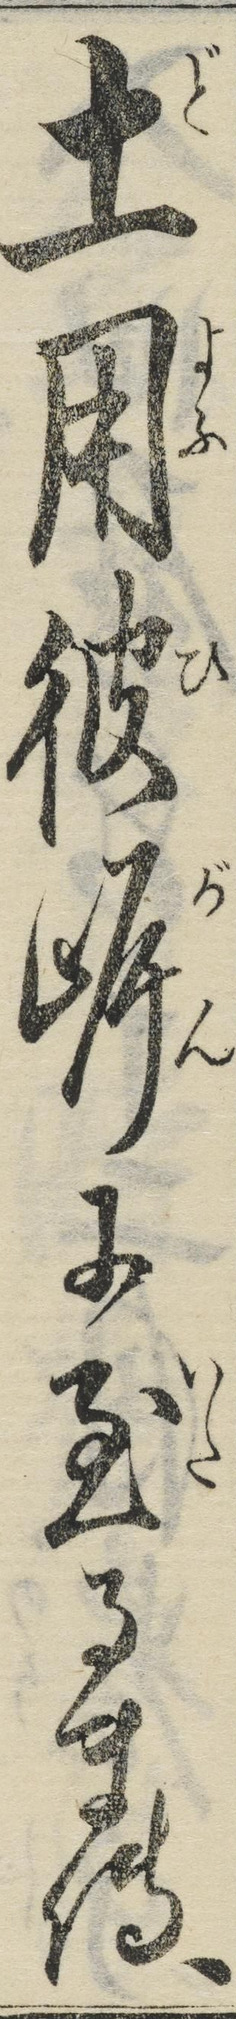土用彼岸に至るまて、
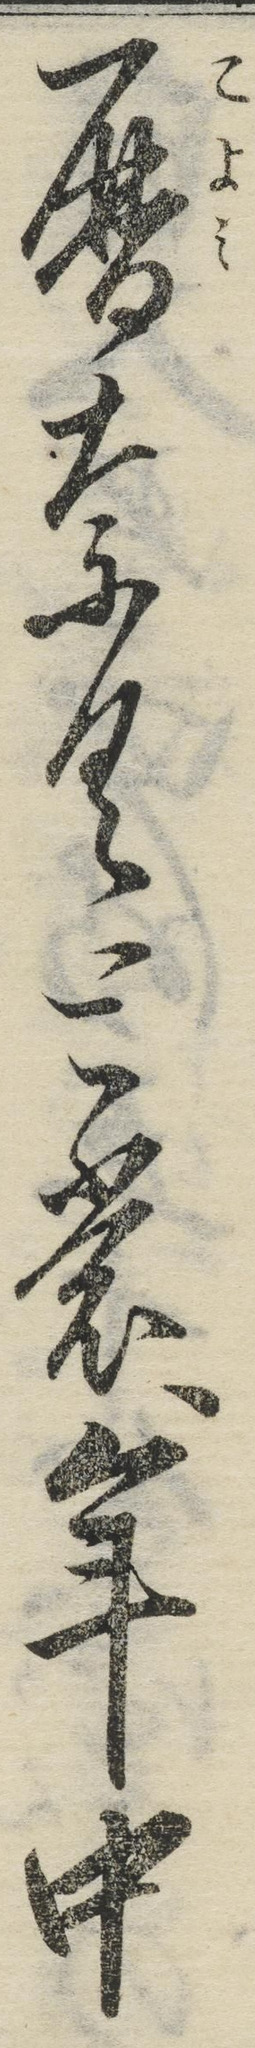暦なくとも、年中
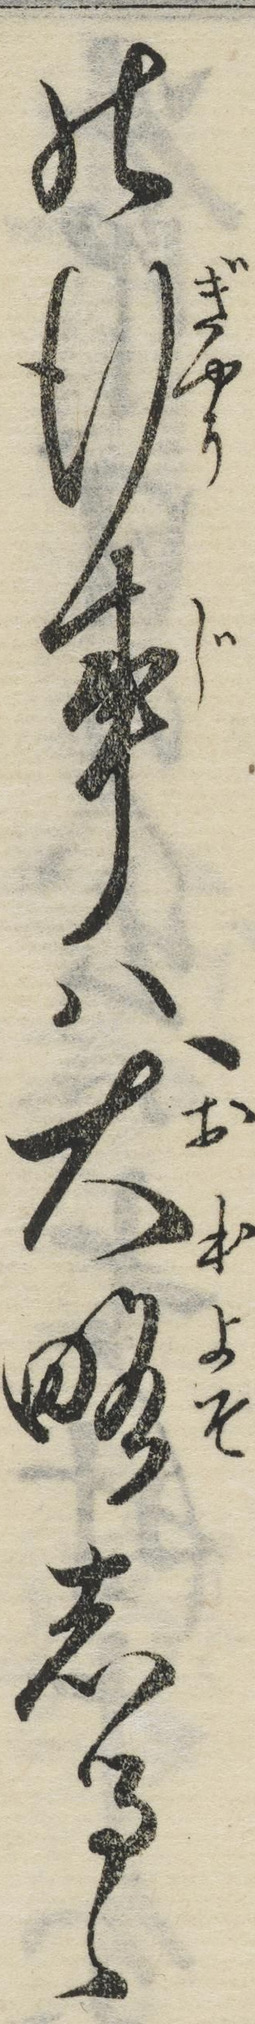の行事は、大略しるゝ

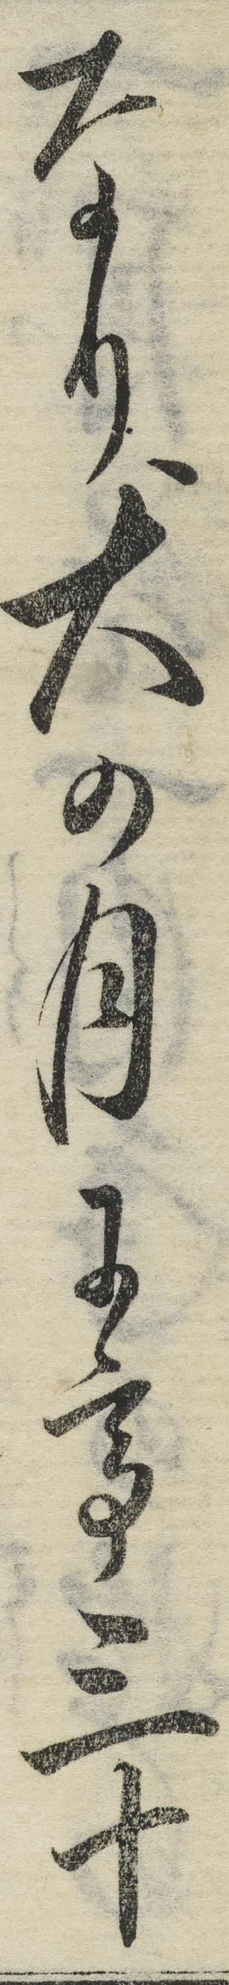なり、大の月にて三十
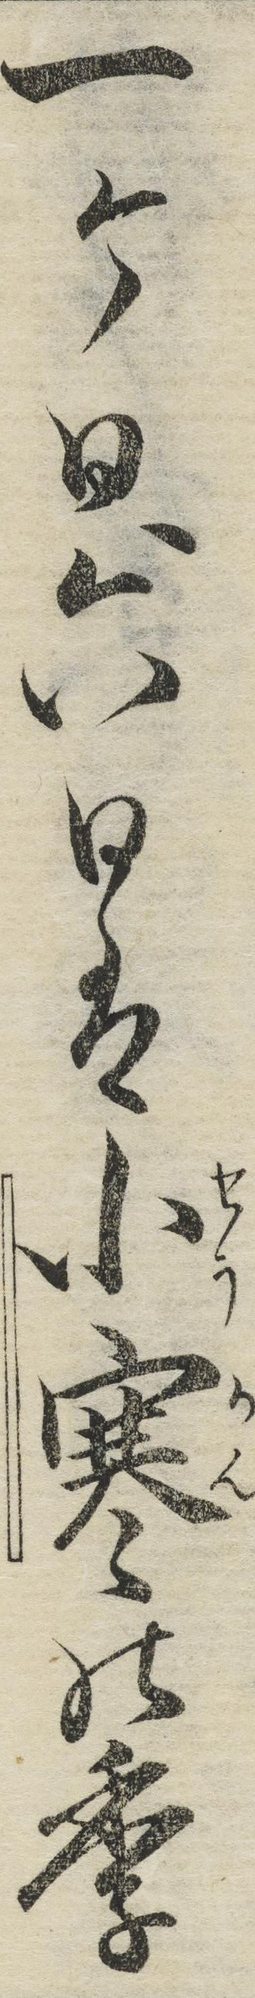一ヶ日、六日は小寒の季
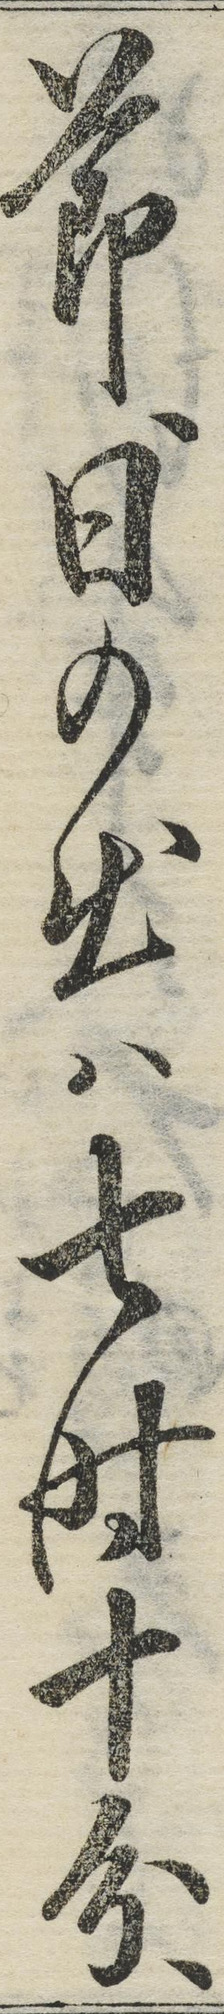節、日の出は七時十分、
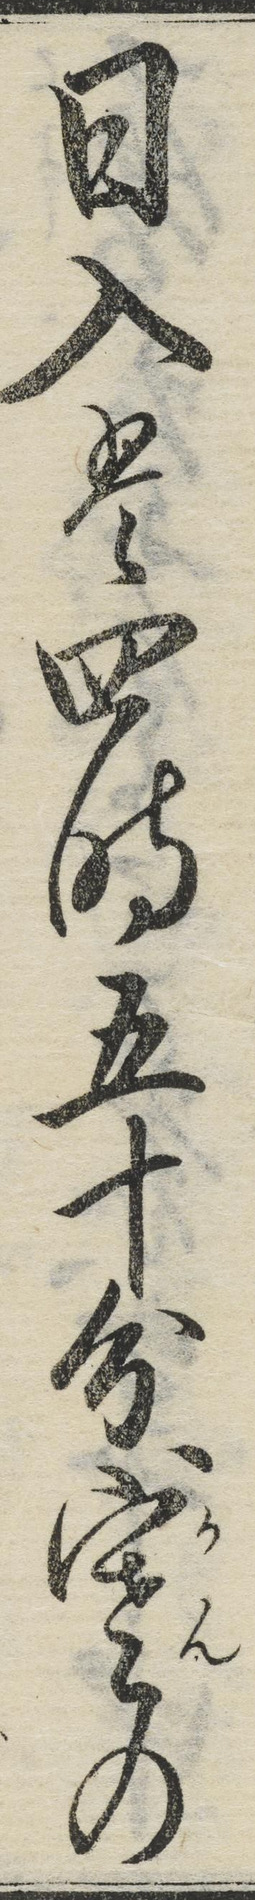日入は四時五十分、寒の
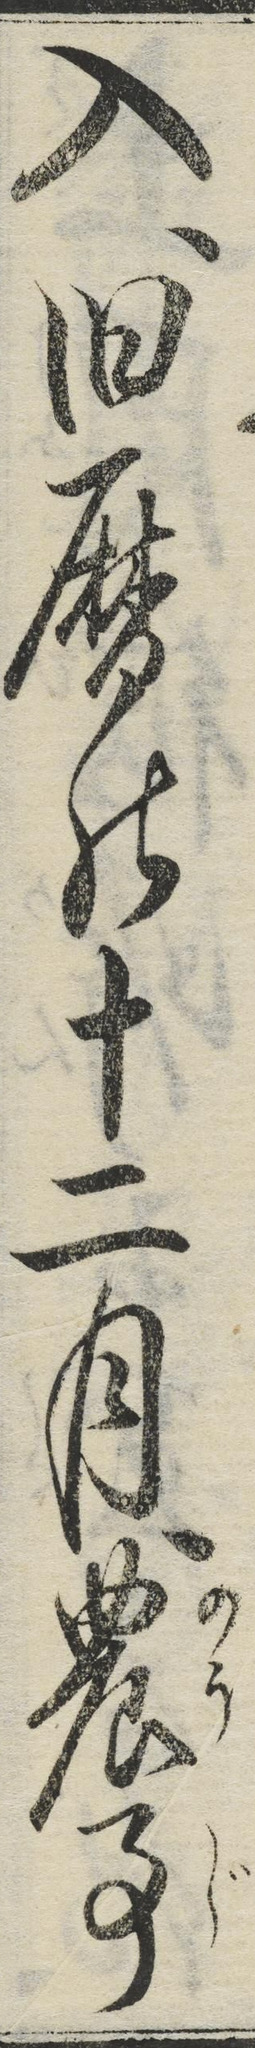入、旧暦の十二月、農事
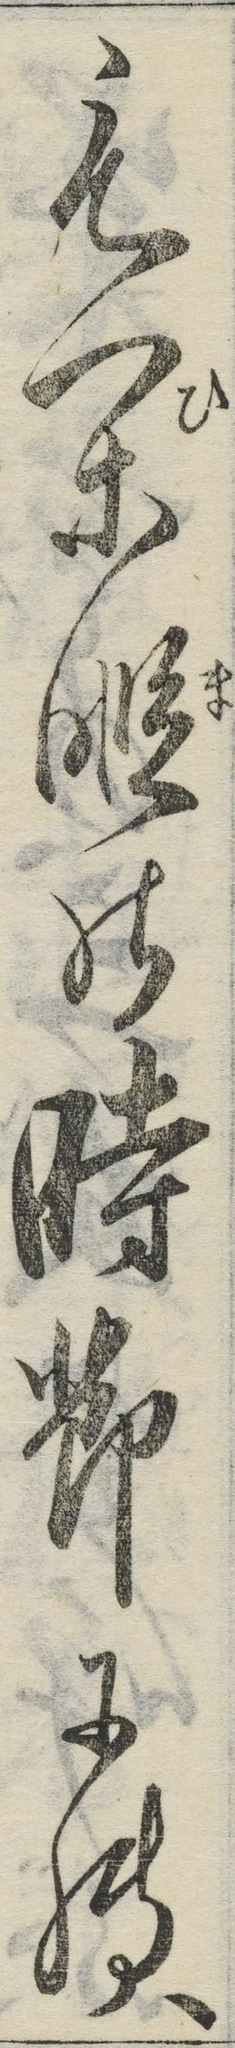も閑暇の時節にて、
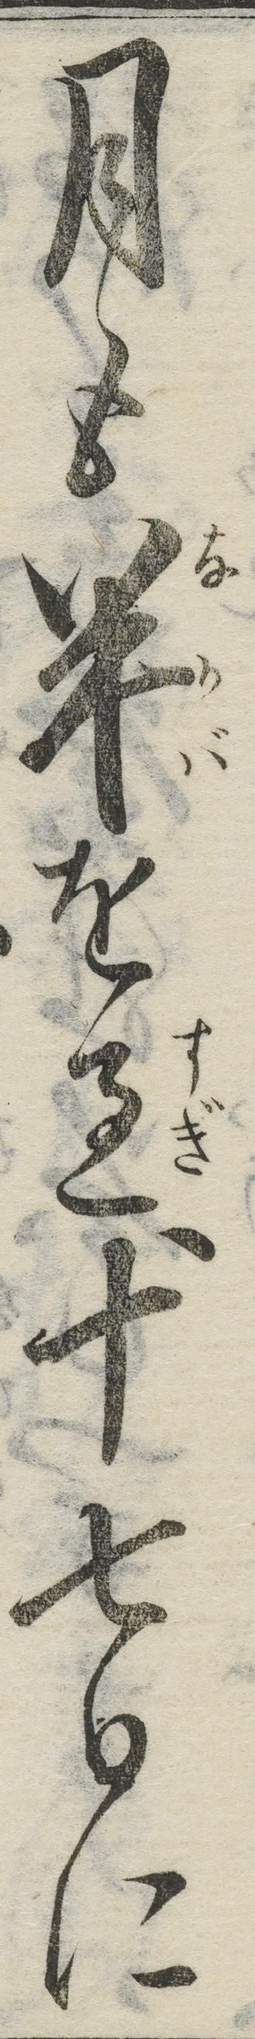月も半を過、十七日に
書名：暦日往来　單
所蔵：東京大学地震研究所図書室 Earthquake Research Institute Library, The University of Tokyo, JAPAN
